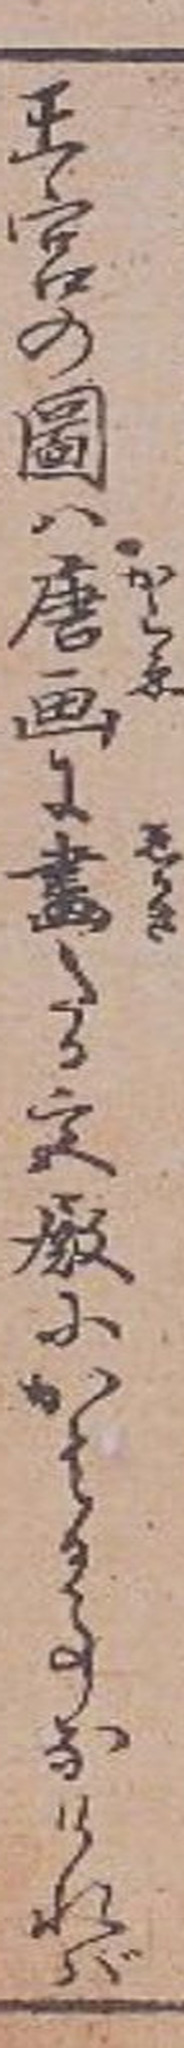王宮の図は•唐画に画たる宮殿にかはる事なければ
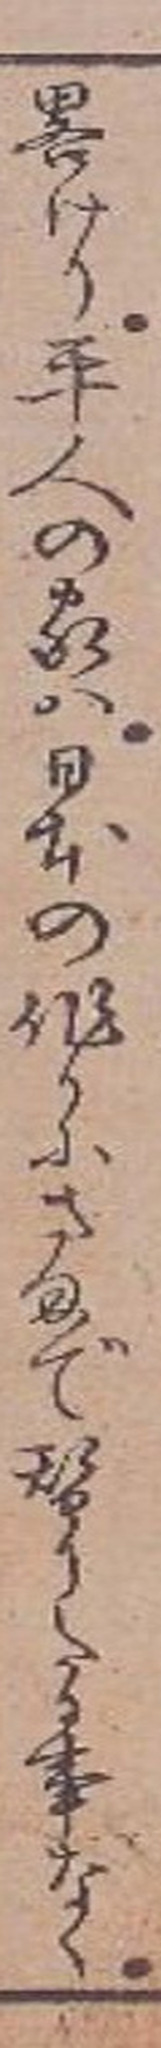略けり•平人の家は•日本の作りにさまで替りたる事なく•

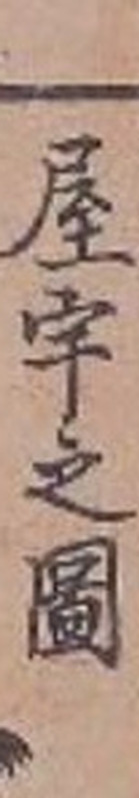屋宇之図
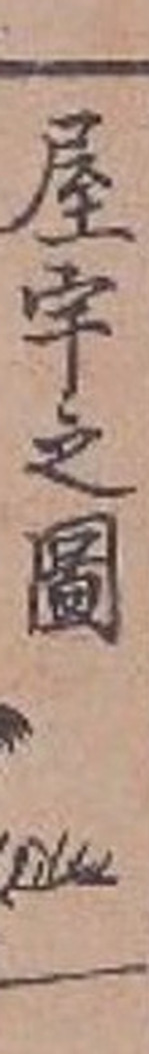屋宇之図

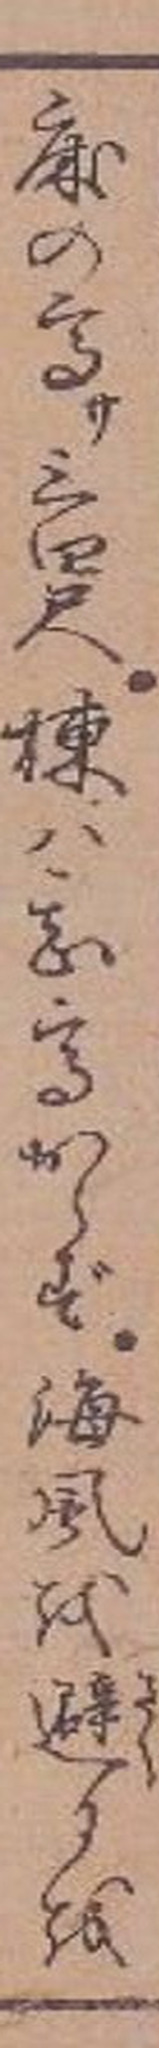床の高さ三四尺•棟は甚高からず•海風を避るを
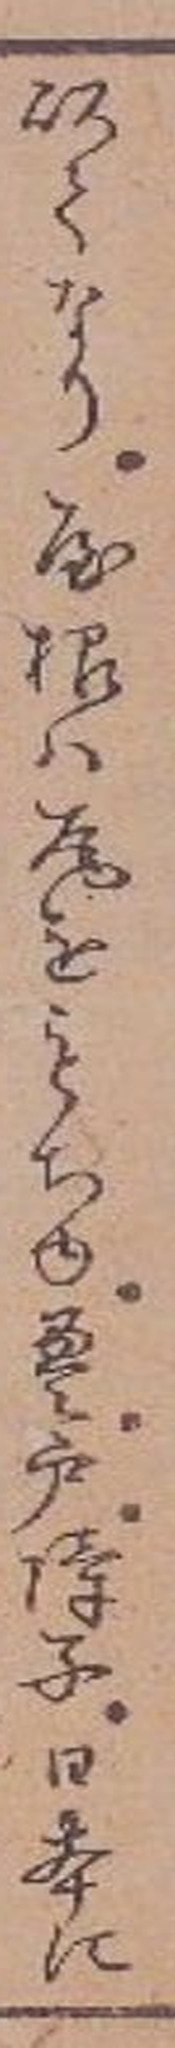以てなり•屋根は瓦をもちゆ•疊•戸•障子•日本に
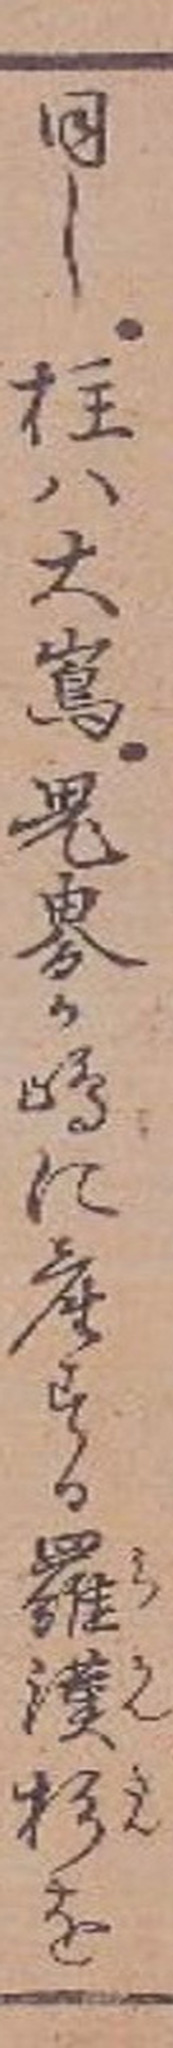同し•柱は大蔦•鬼界か嶋に産する羅漢杉を
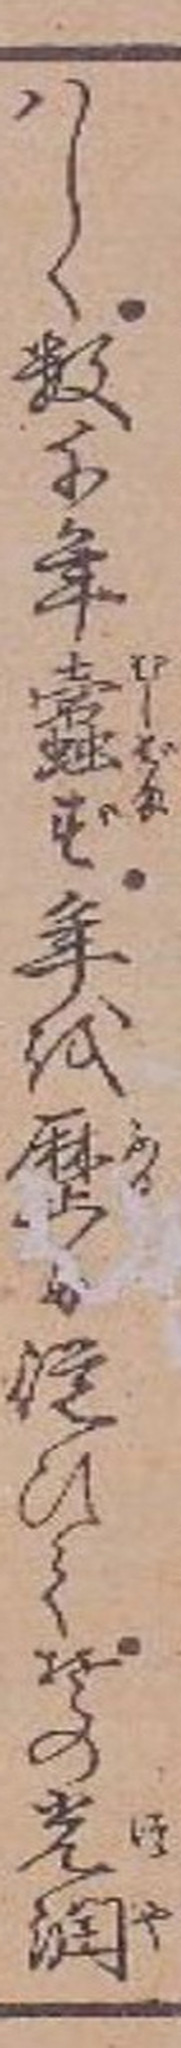はしく•数先年蠧ず•年を歴に従ひて•その光潤
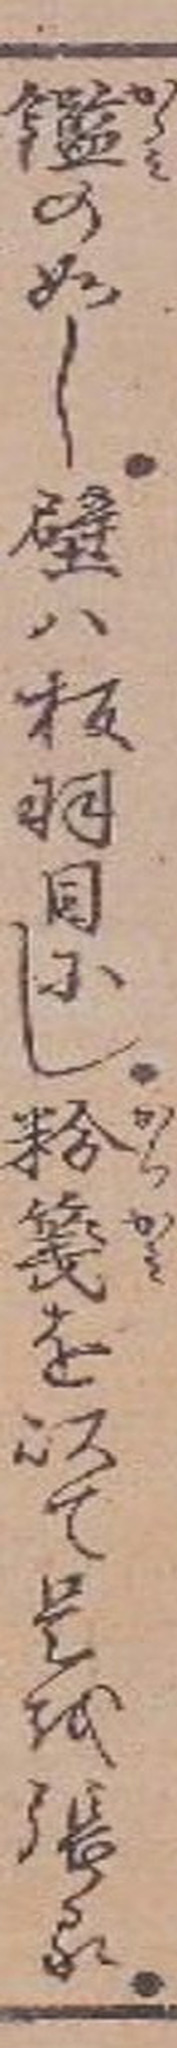鑑の如し•壁は板羽目にし•粉箋を以て是を張る•
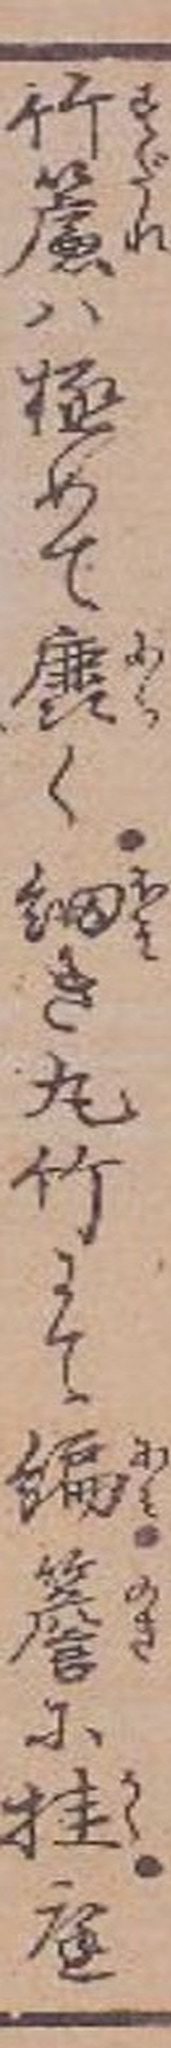竹簾は極めて麁く•細き丸竹にて編•簷に桂•庭
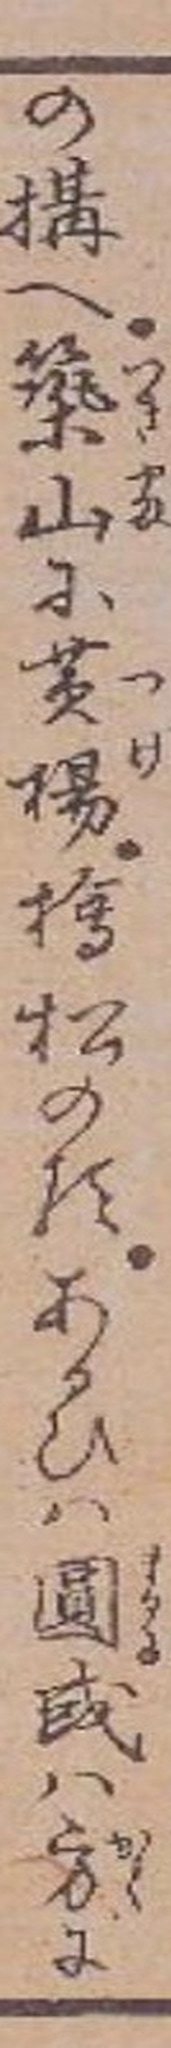の構へ•築山に黄揚•松の類•あるひは円•或は方に
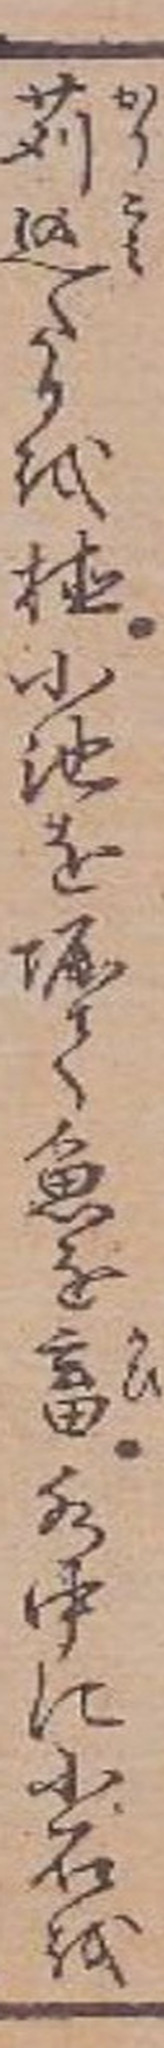苅込たるを植•小池を掘て魚を畜•水中に小石を
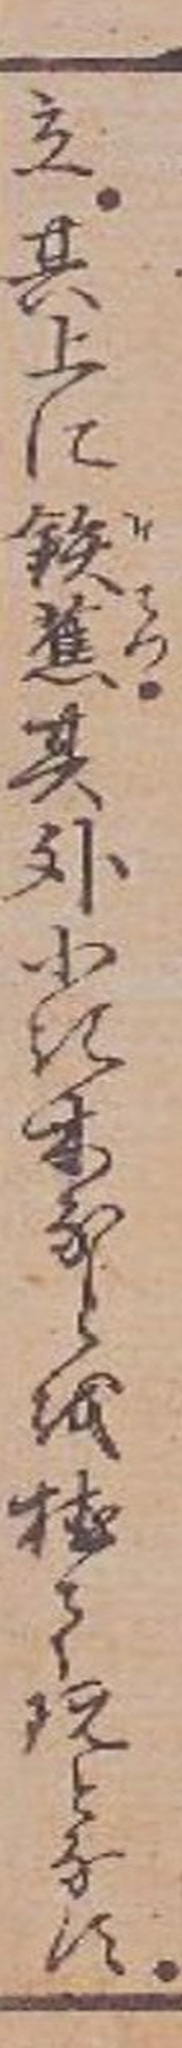立•其上に鉄蕉•其外小き木なとを植て玩となす•
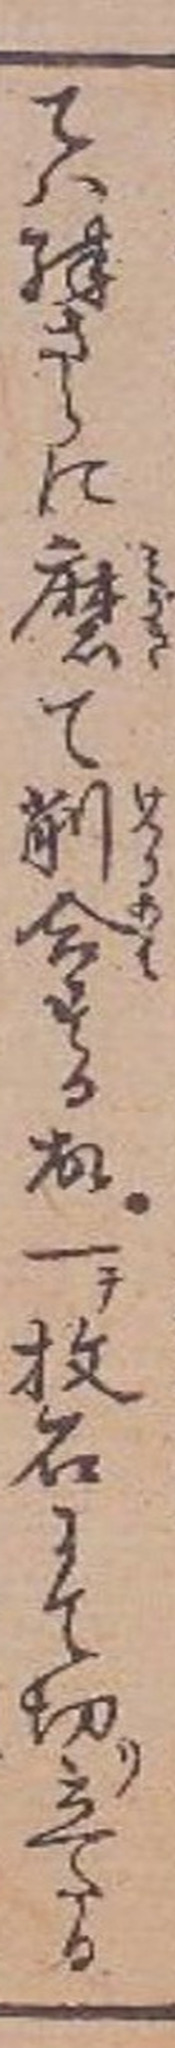ては殊さらに磨て削合する故•一ち枚石にて切立たる
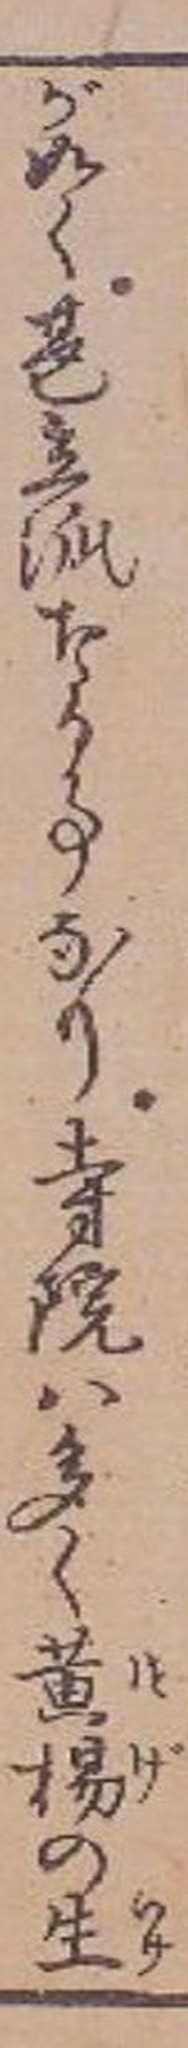が如く•芭立派なる事なり•寺院は多く黄揚の生
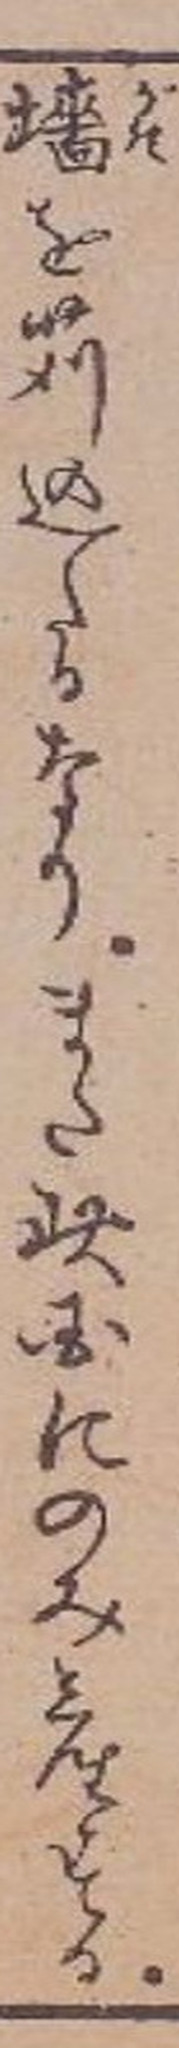墻を苅込たるなり•また此国にのみ産する•
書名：琉球談
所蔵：University of the Ryukyus Library
